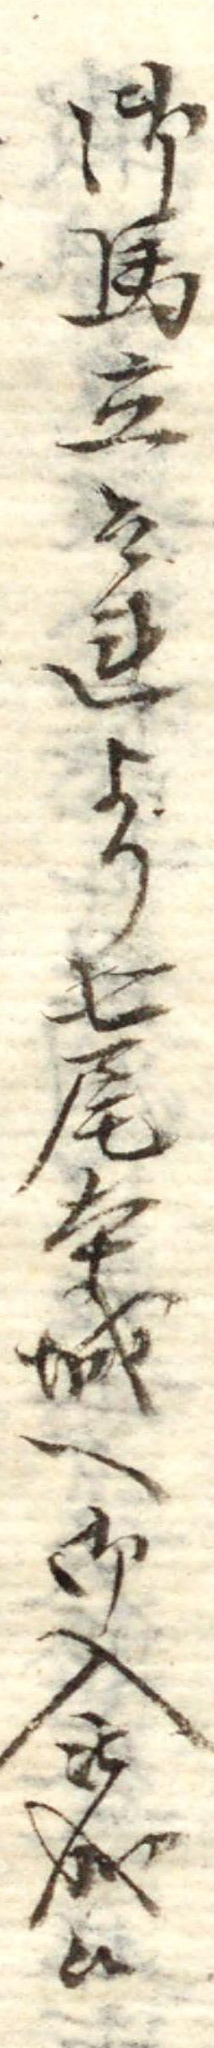御馬立召連より七尾本城へ御入被成候
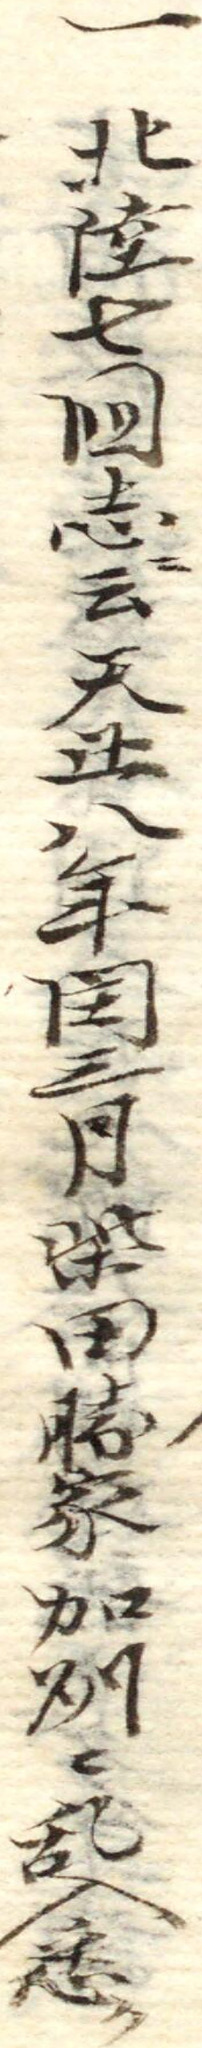一北陸七国志に云天正八年閏三月柴田勝家加州に乱入悉く
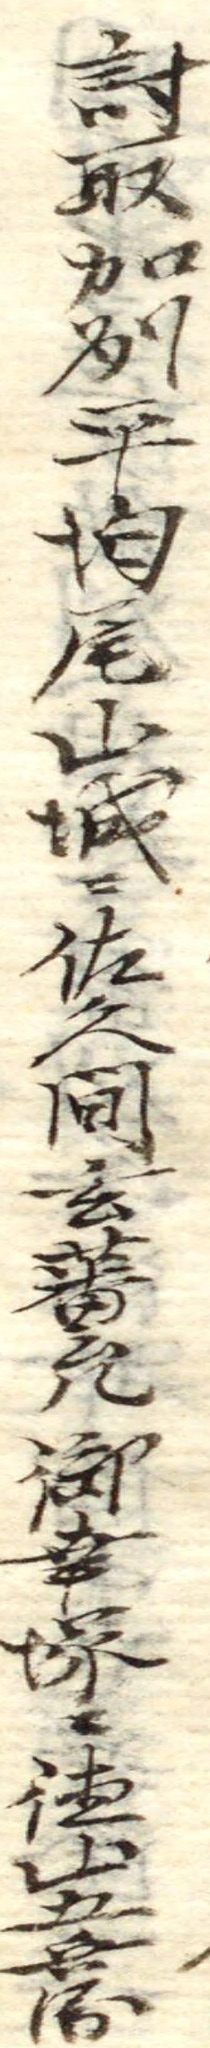討取加州平均尾山城に佐久間玄蕃允御幸塚に徳山五兵衛
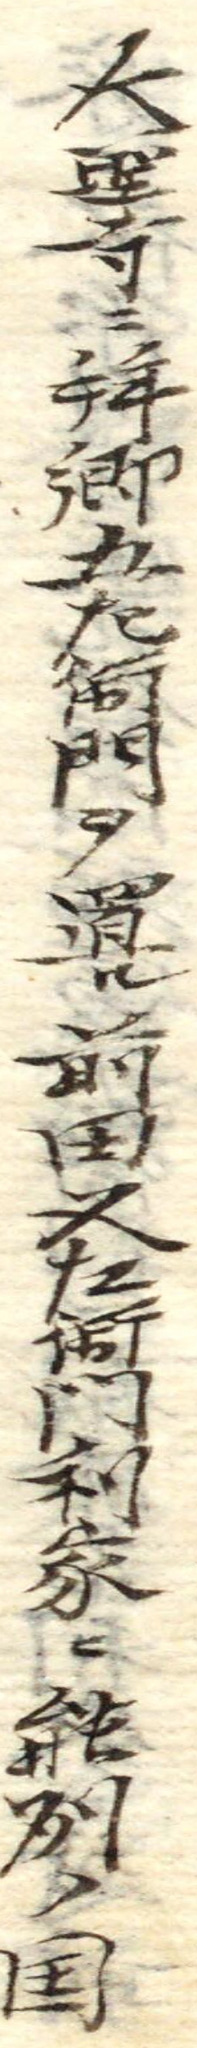大聖寺に拝郷五左衛門を置る前田又左衛門利家に能州の国
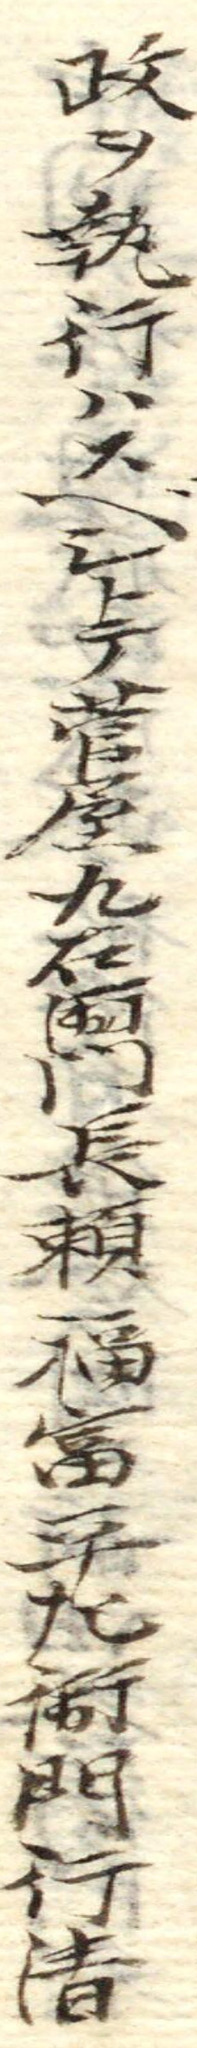政を執行はすべしとて菅屋九右衛門長頼福富平左衛門行清
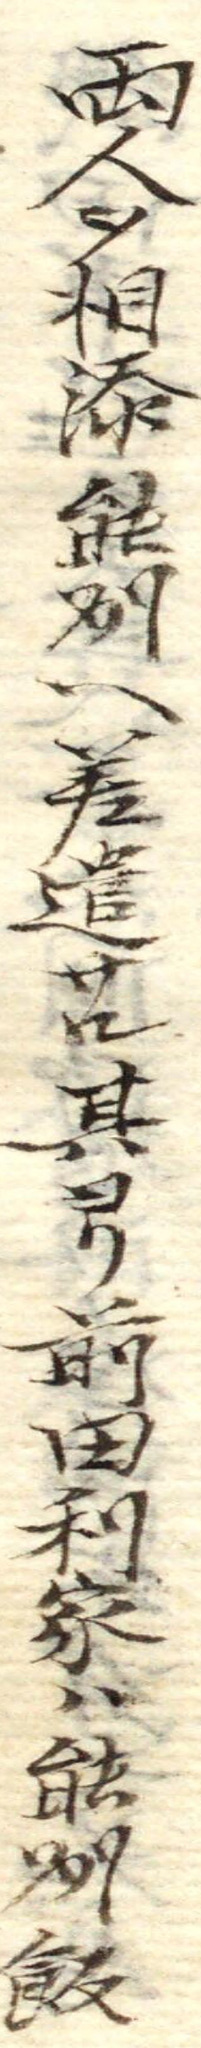両人を相添能州へ差遣さる其より前田利家は能州飯
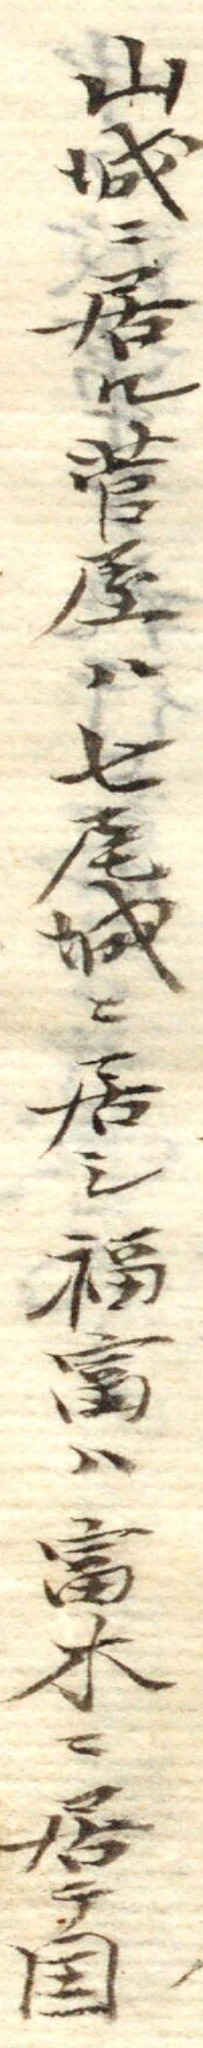山城に居る菅屋は七尾城に居し福富は富木に居て国

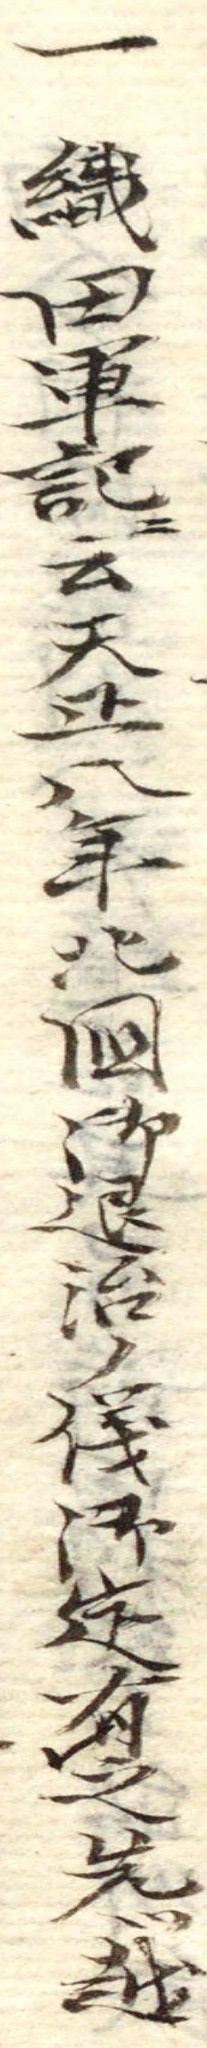一織田軍記に云天正八年北国御退治の儀御定有之先つ越
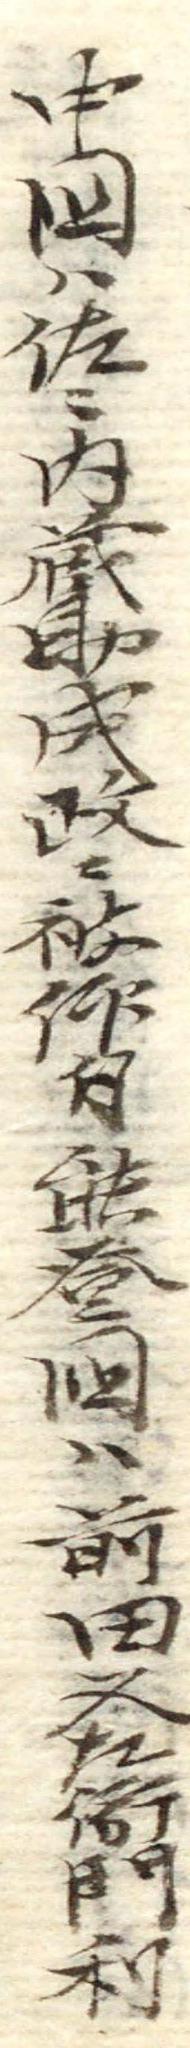中国は佐々内蔵助成政に被仰付能登国は前田又左衛門利
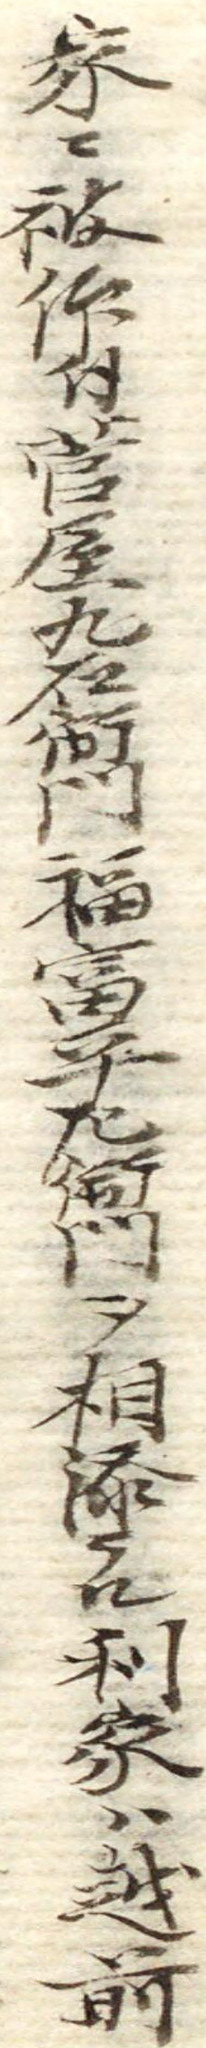家に被仰付菅屋九右衛門福富平左衛門を相添らる利家は越前
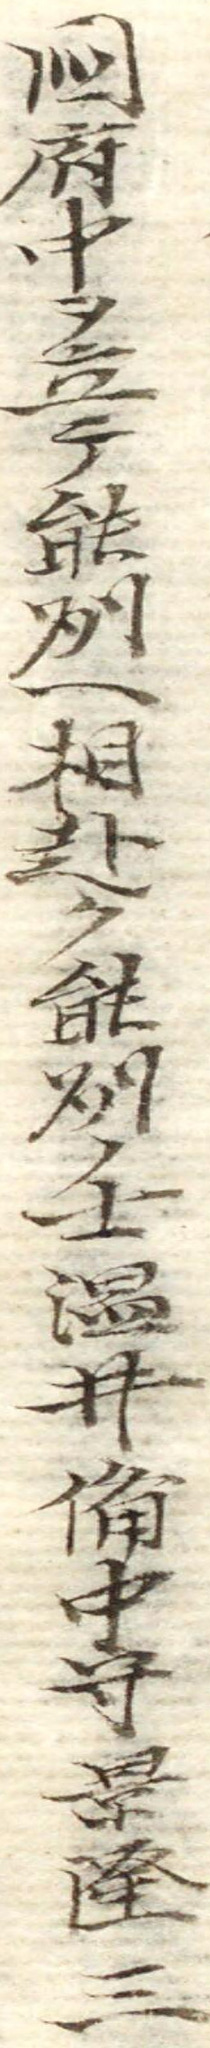国府中を立て能州へ相赴く能州の士温井備中守景隆三
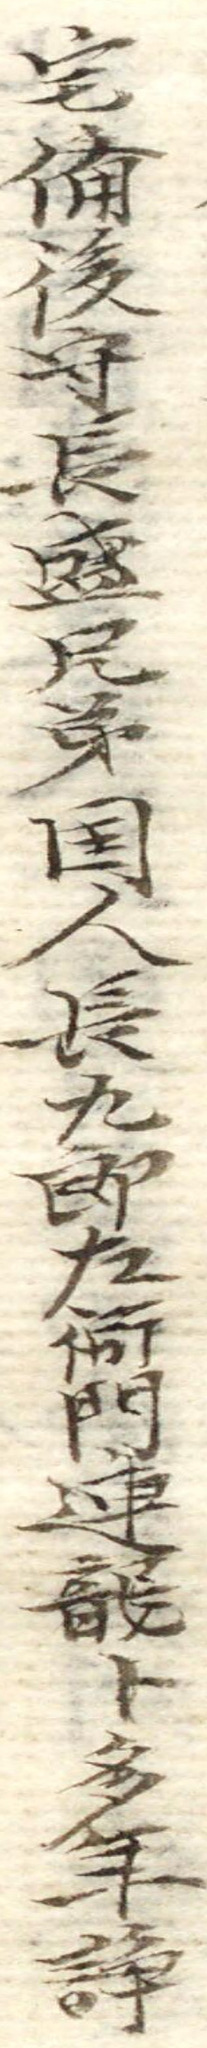宅備後守長盛兄弟国人長九郎左衛門連龍と多年諍
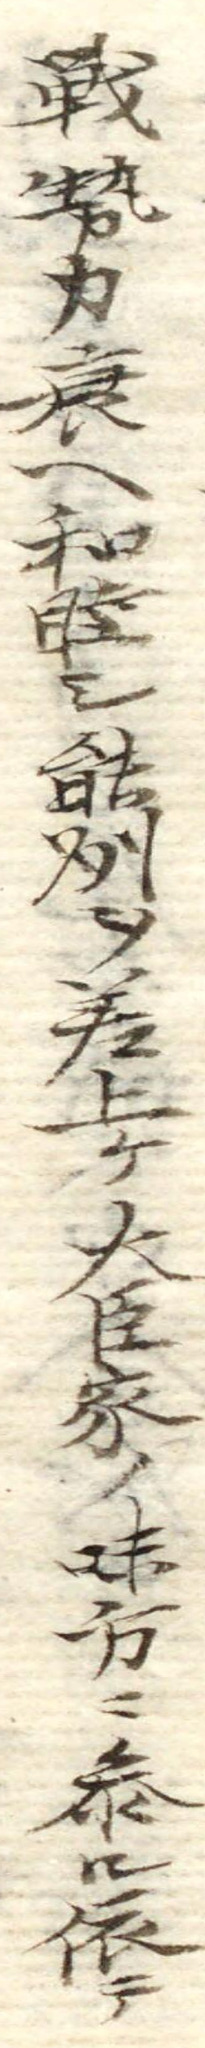戦勢力衰へ和睦し能州を差上け大臣家の味方に参る依て
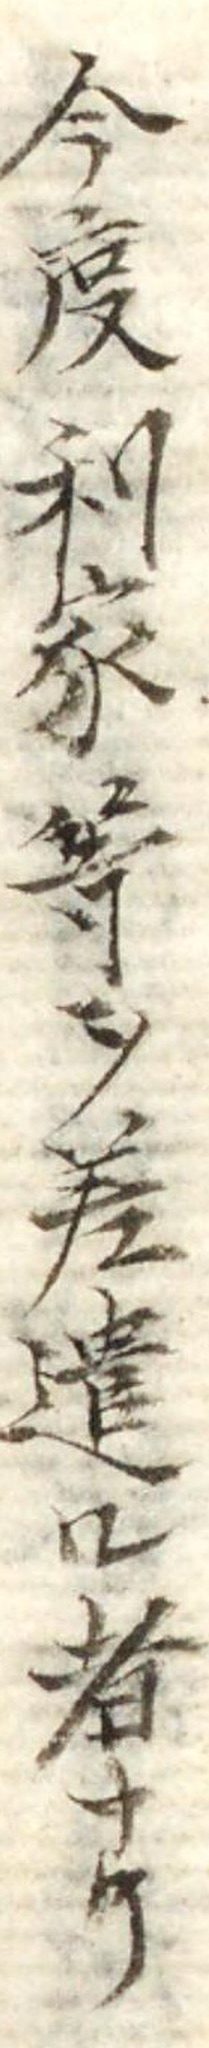今度利家等に差遣る者なり
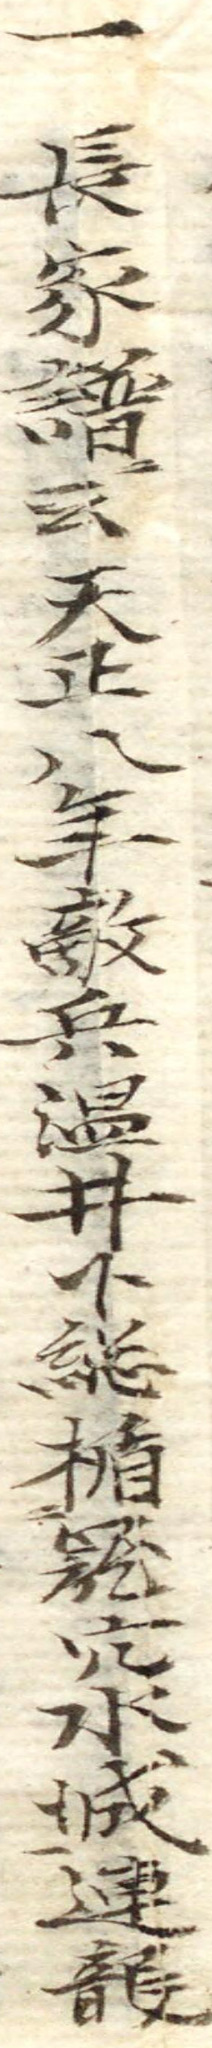一長家譜に云天正八年敵兵温井下総楯籠穴水城連龍
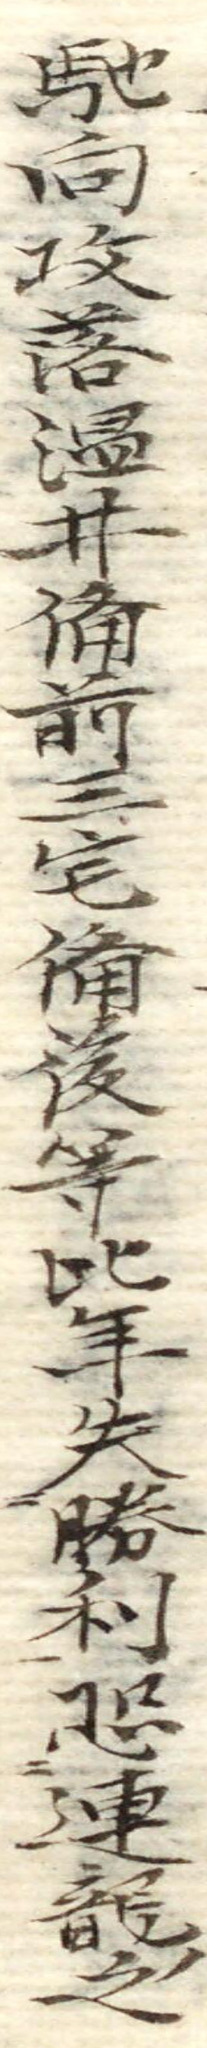馳向攻落温井備前三宅備後等比年失勝利恐連龍之
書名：前田家封国証書集録
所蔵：Ishikawa Prefectural Library
